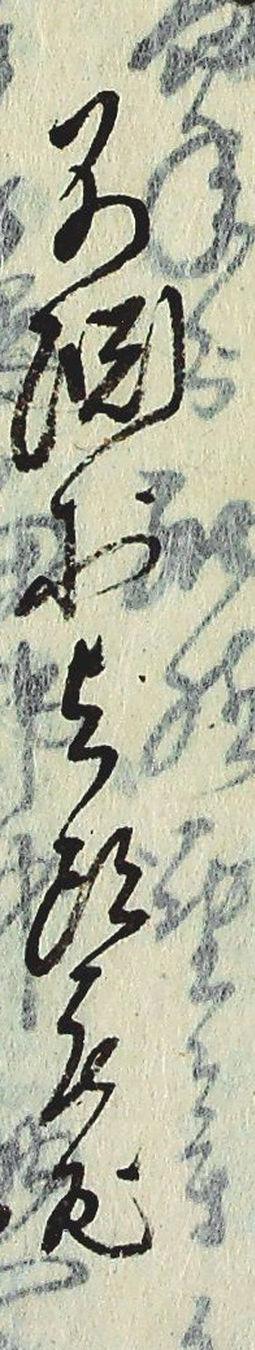早淵村与頭庄屋
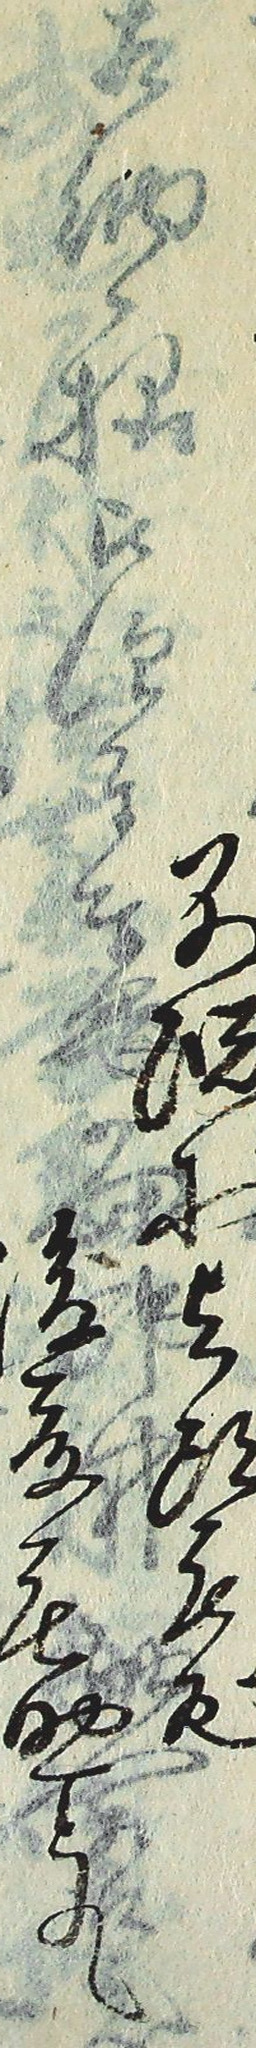後藤庄助とのへ
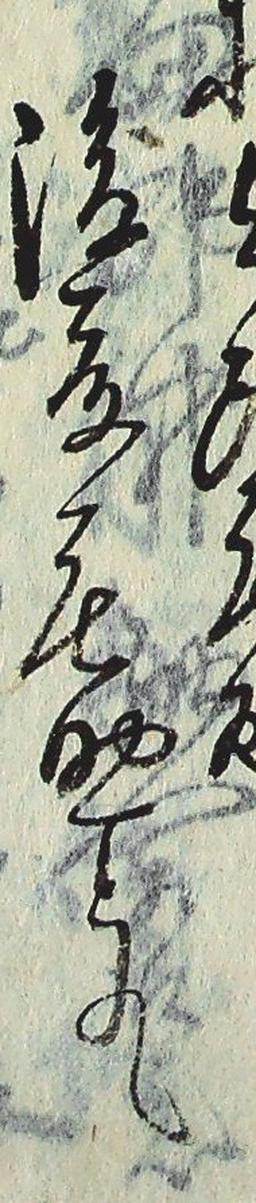後藤庄助とのへ
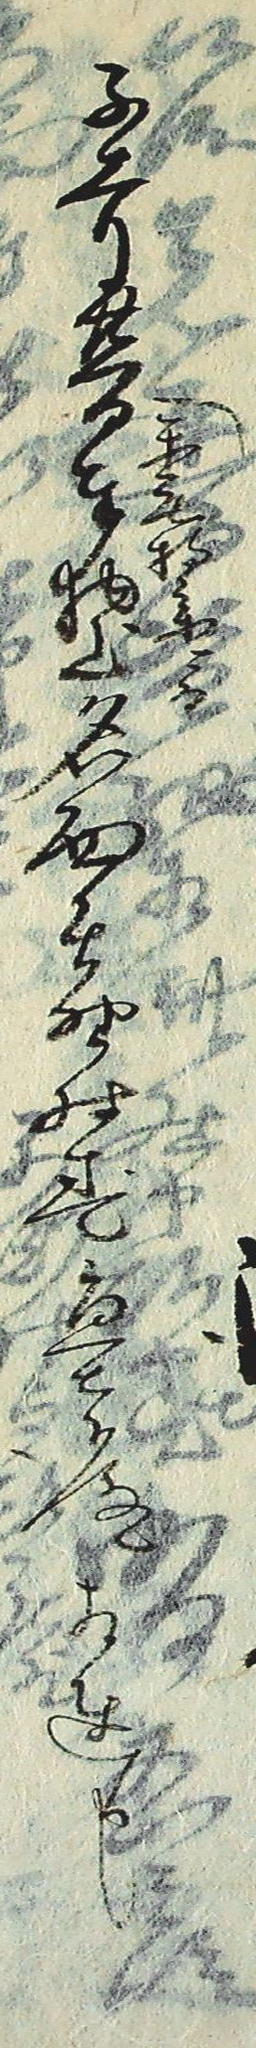子十一月廿一日奉拝上名西矢野村盛宣七郎殿へ相達申候
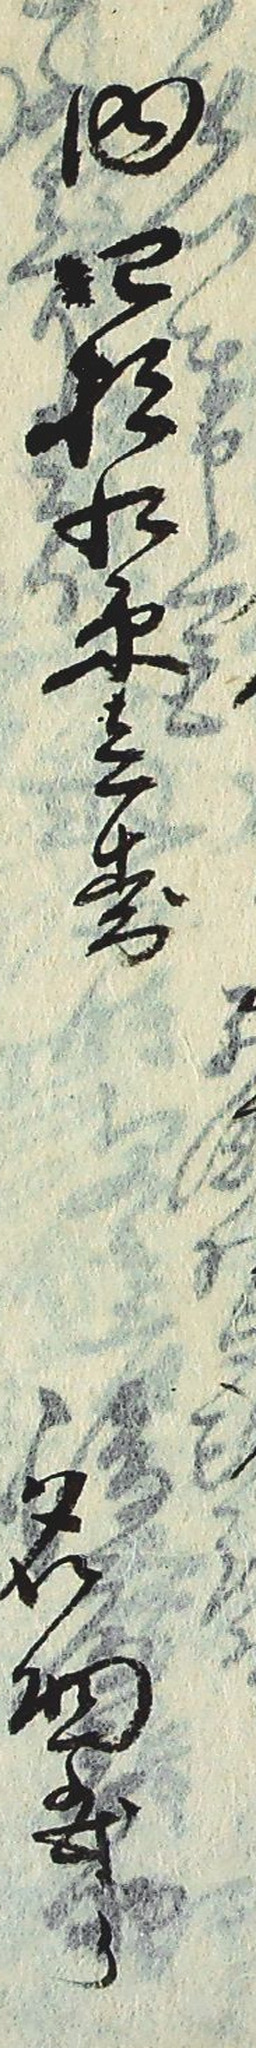内四拾九束壱歩名西当り

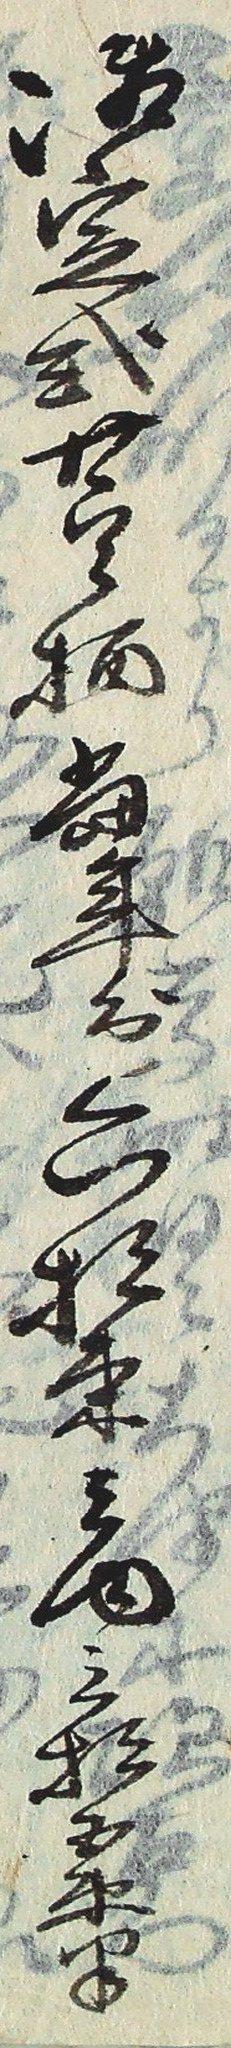御定式苧柄当年ゟ六拾束之内三拾五束半
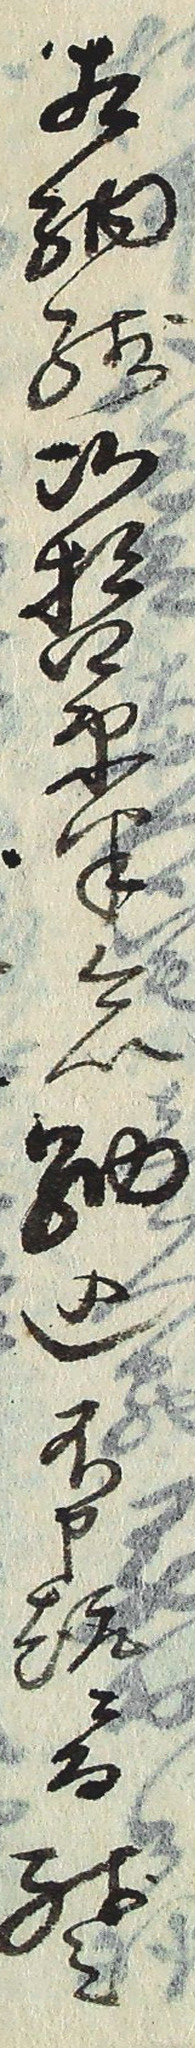相納残弐拾四束半今以納込不申趣にて残之
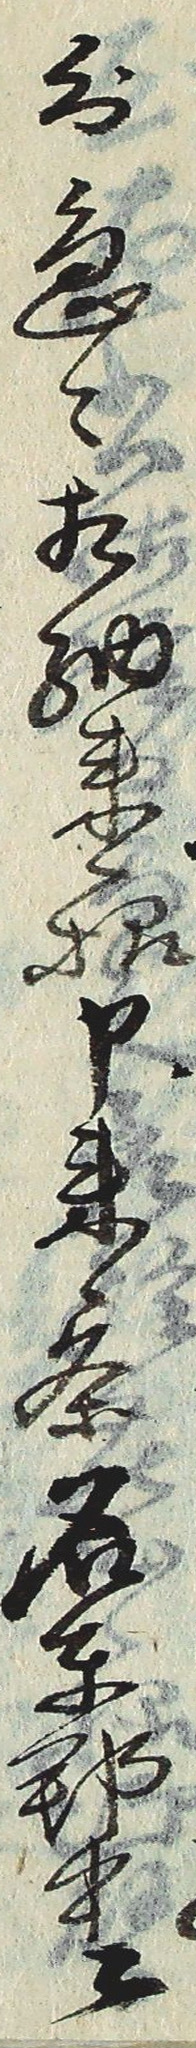分急々相納来候様申来候条名東郡中に
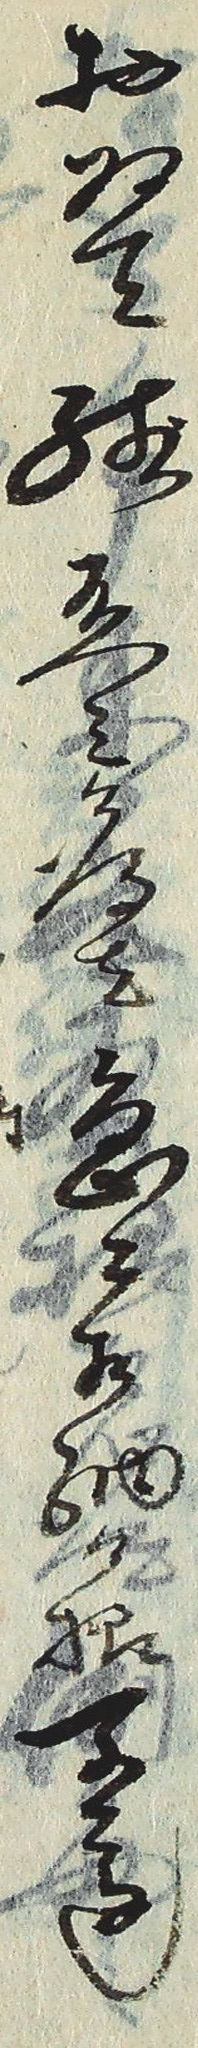おゐて残有之候得は急々相納候様可遂
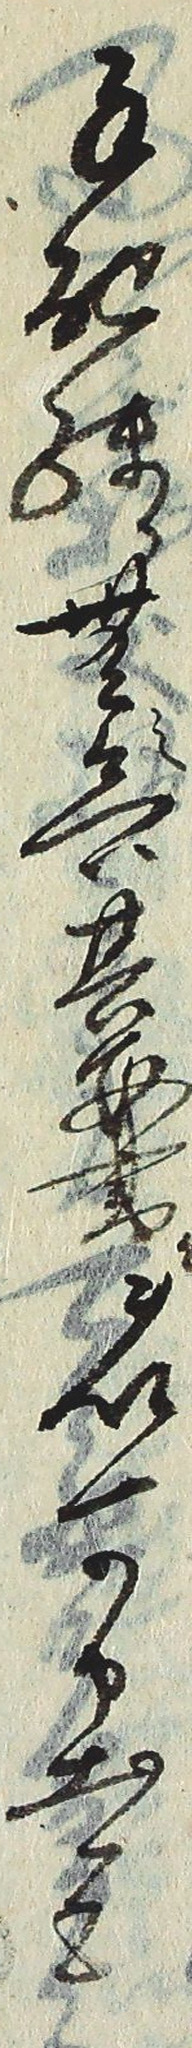手配残り無候へは其段書付を以可申出候以上
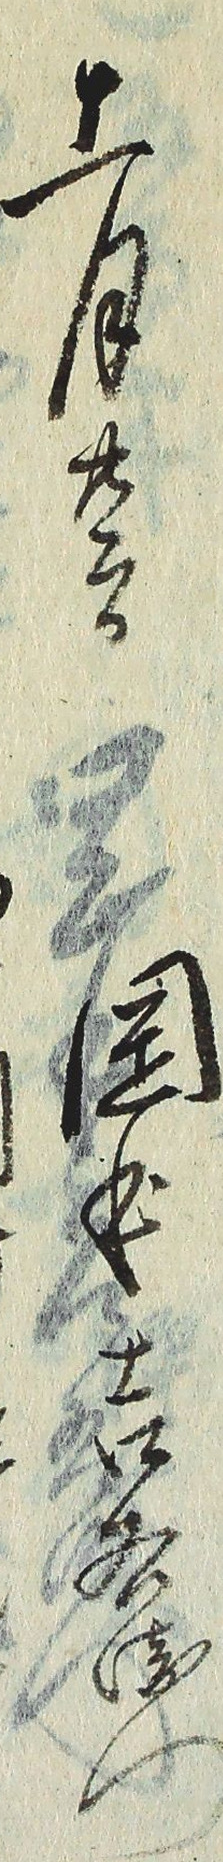十一月廿二日岡本吉右衛門
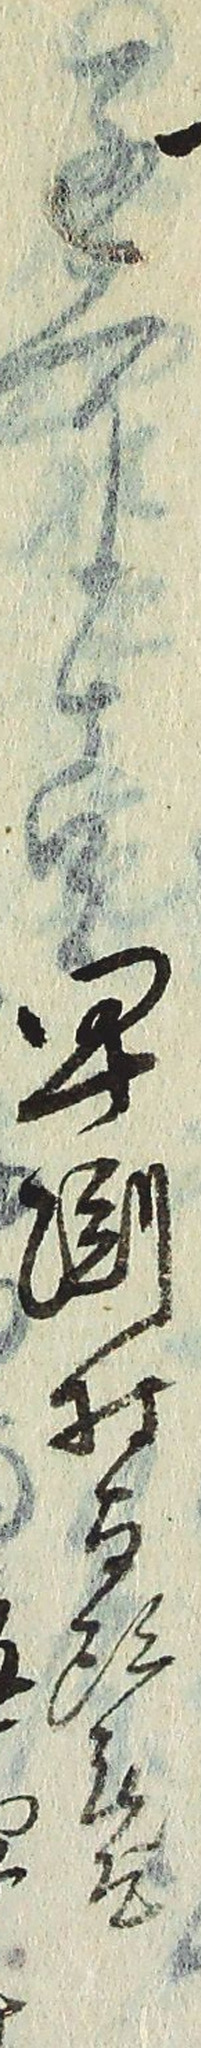早淵村与頭庄屋
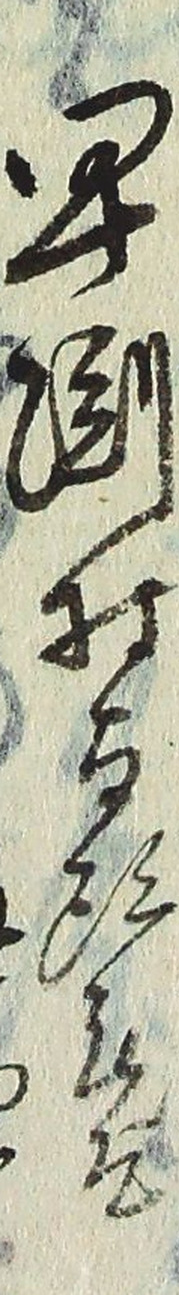早淵村与頭庄屋
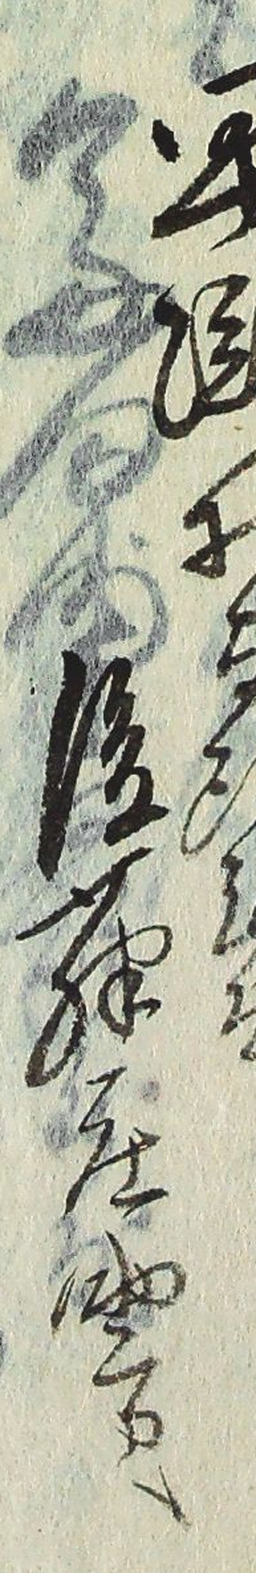後藤庄助方へ
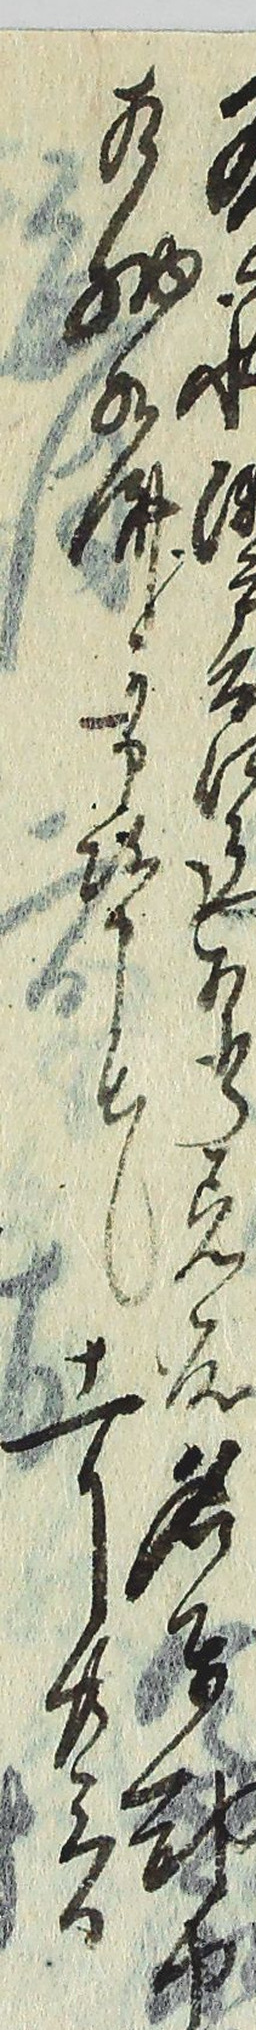相納相済可申趣申出候十一月廿三日
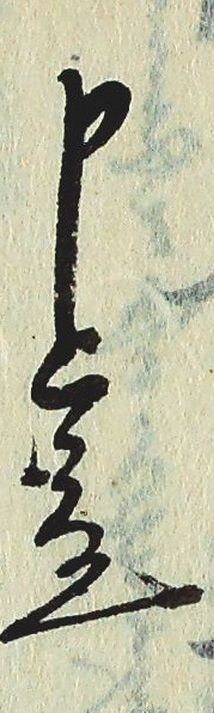申上覚
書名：名東郡中諸割賦元帳
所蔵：鳴門教育大学 Naruto University of Education
